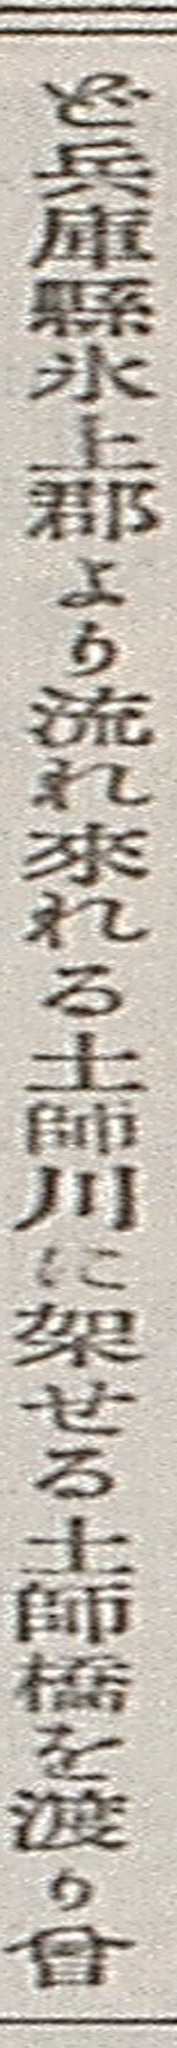ど兵庫縣氷上郡より流れ来れる土師川に架せる土師橋を渡り曽
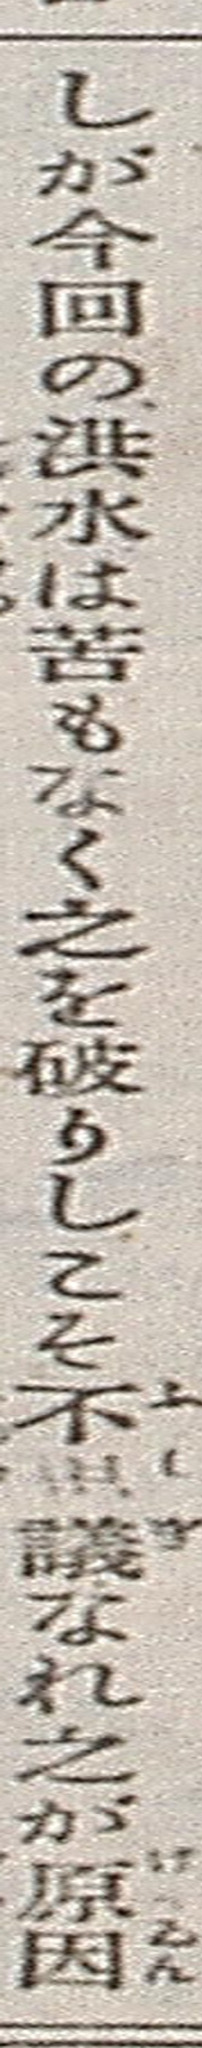しが今回の洪水は苦もなく之を破りしこそ不思議なれ之が原因
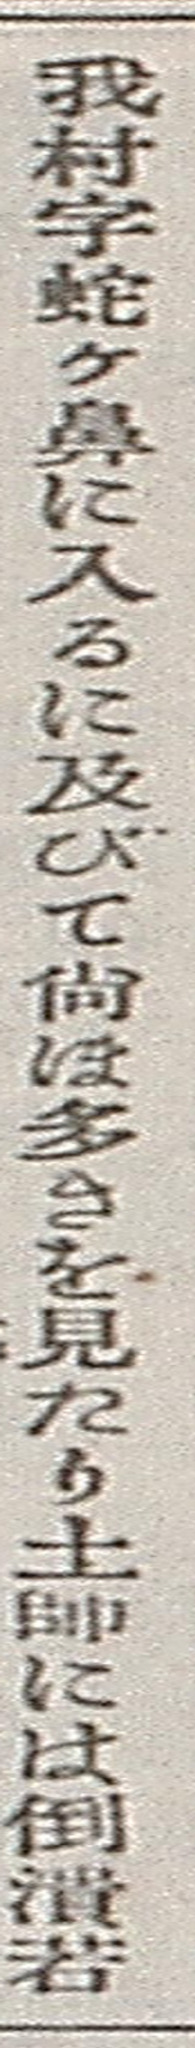我村字蛇ヶ鼻に入るに及びて尚ほ多きを見たり土師には倒潰若
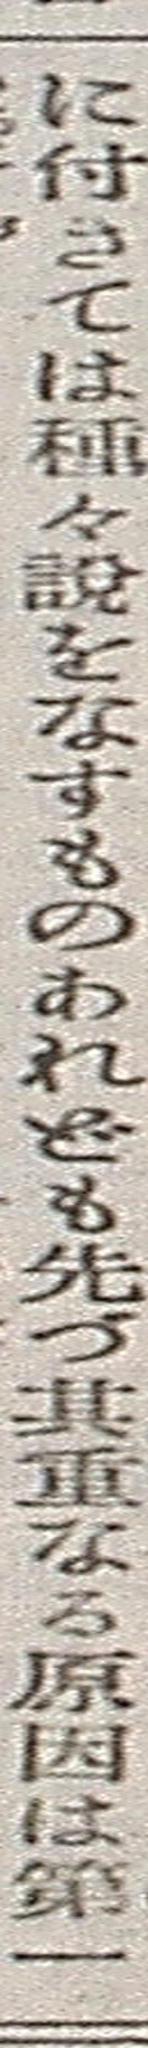に付きては種々説をなすものあれども先づ其重なる原因は第一
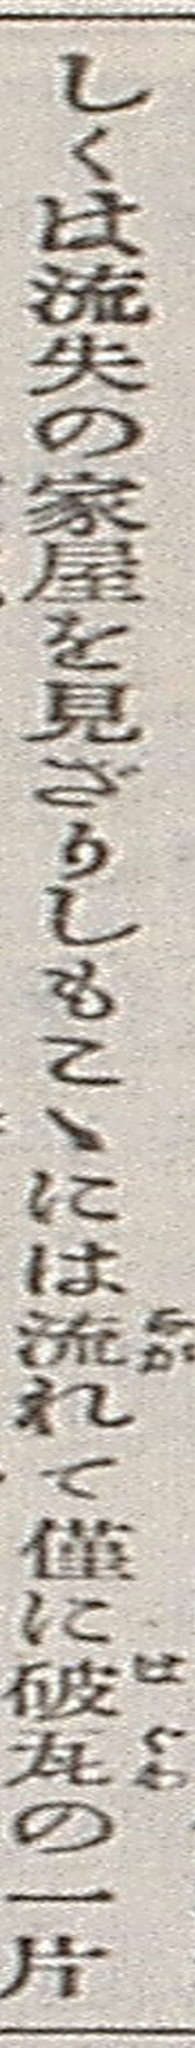しくは流失の家屋を見ざりしもこゝには流れて僅に破瓦の一片
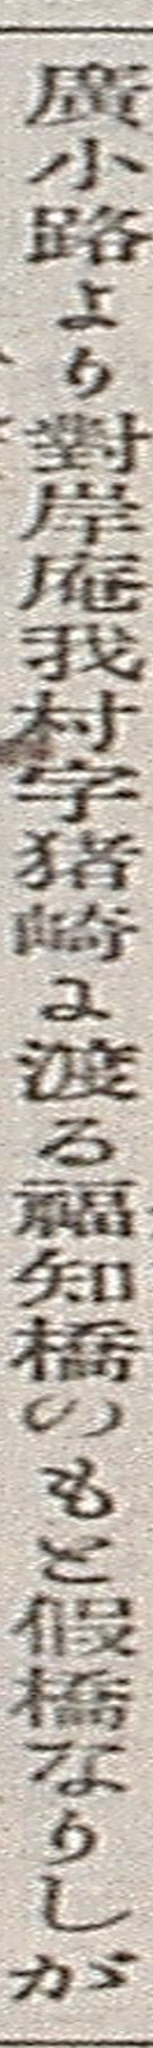広小路より対岸庵我村字猪崎に渡る福知橋のもと仮橋なりしが
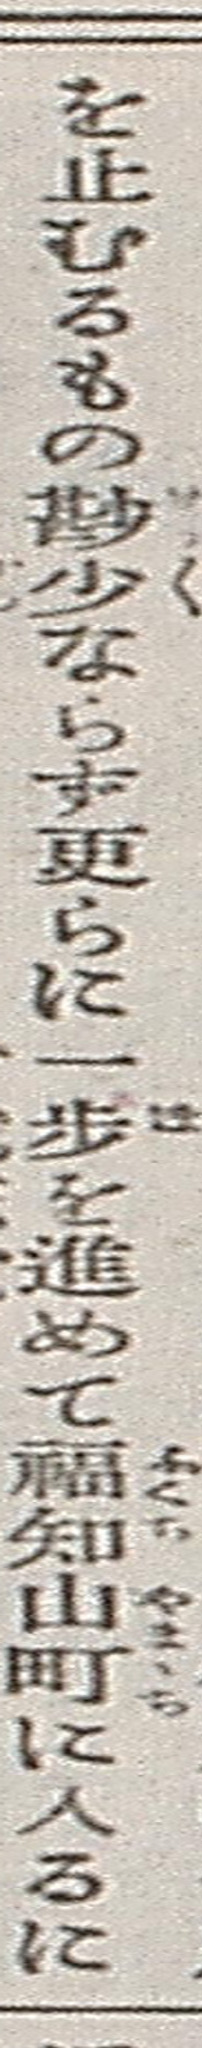を止むるもの尠少ならず更らに一歩を進めて福知山町に入るに
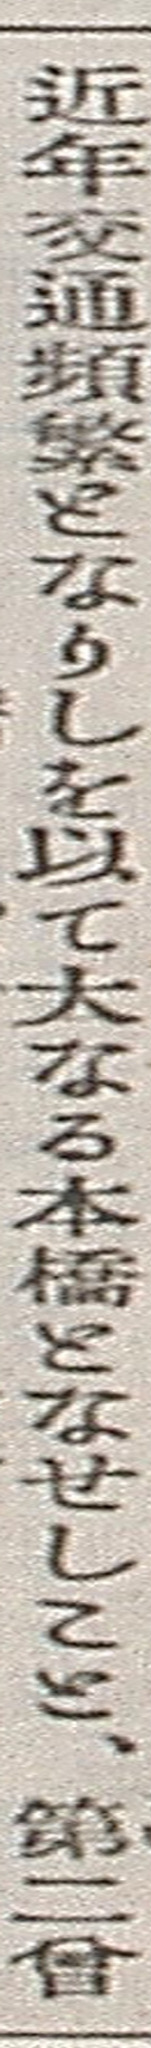近年交通頻繁となりしを以て大なる本橋となせしこと、第二曾
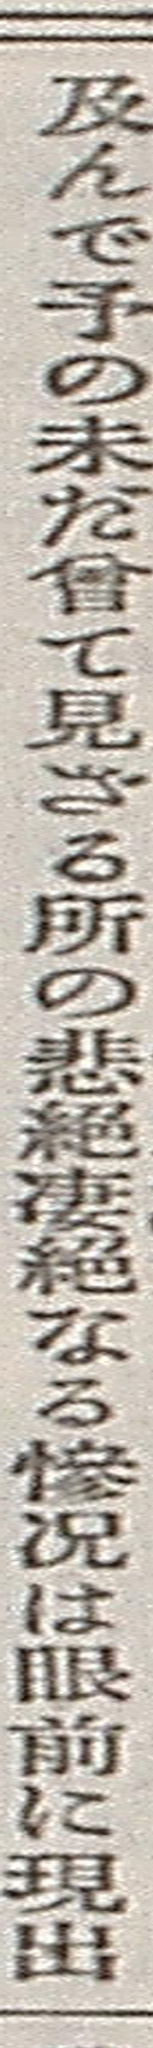及んで予の未だ曾て見ざる所の悲絶凄絶なる惨況は眼前に現出
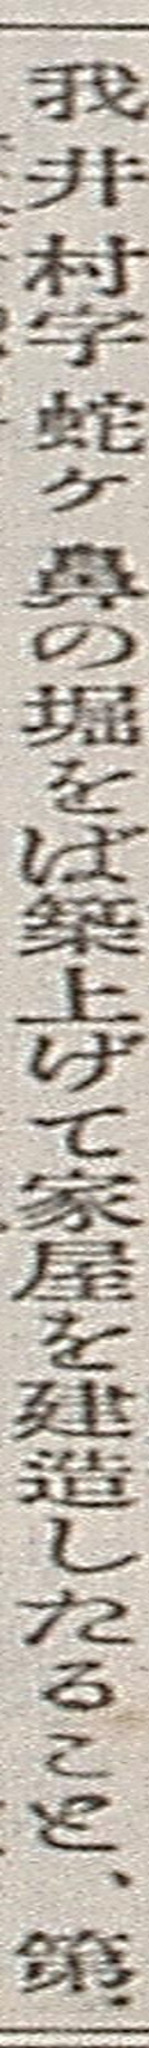我井村字蛇ヶ鼻の堀をば築上げて家屋を建造したること、第
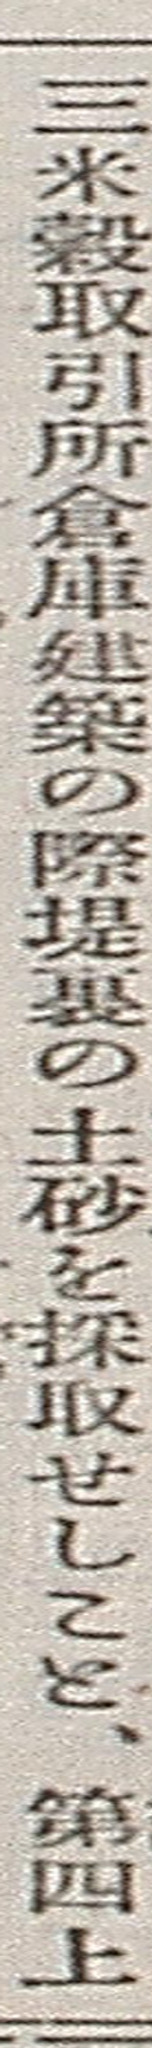三米穀取引所倉庫建築の際堤裏の土砂を採取せしこと、第四上
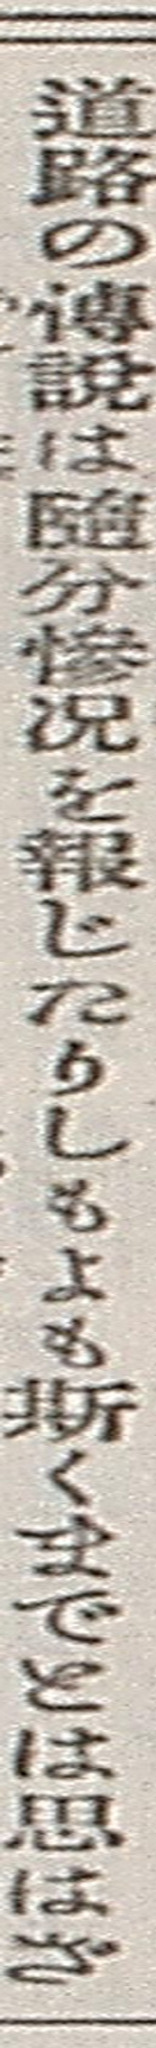道路の伝説は随分惨況を報じたりしもよも斯くまでとは思はざ
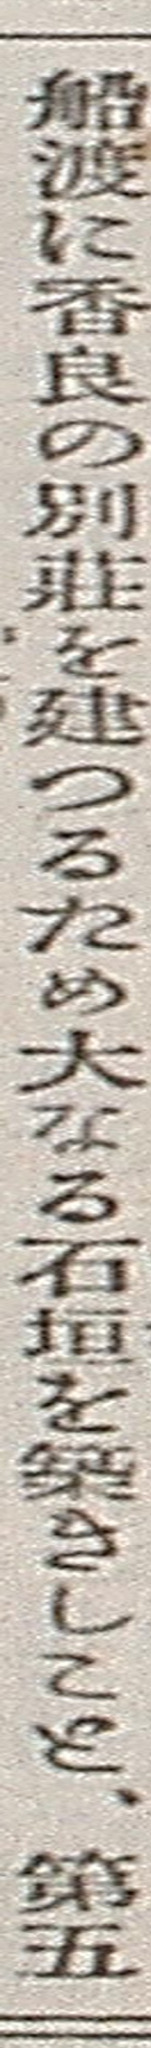渡船に香良の別荘を建つるため大なる石垣を築きしこと、第五
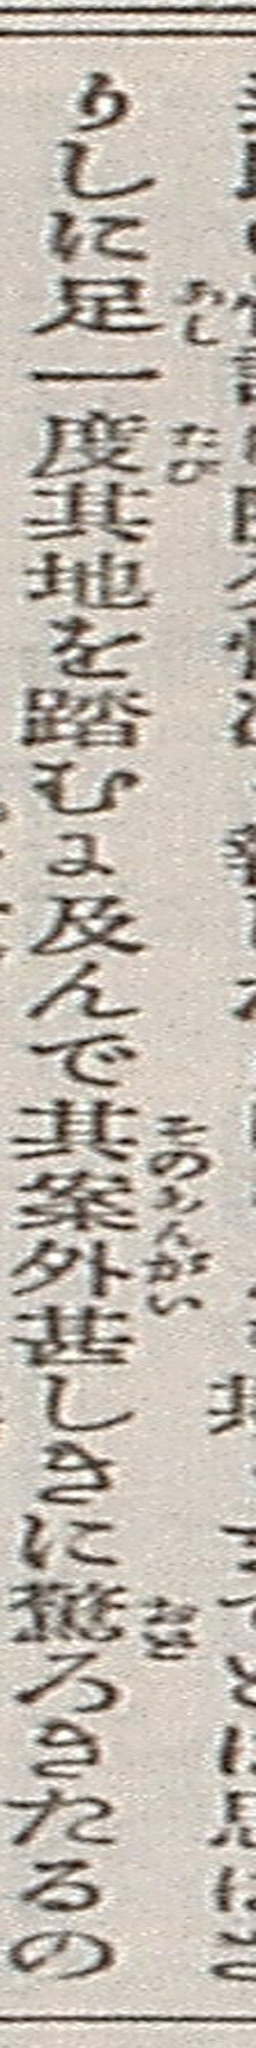りしに足一度其地を踏むに及んで其案外甚しきに驚ろきたるの
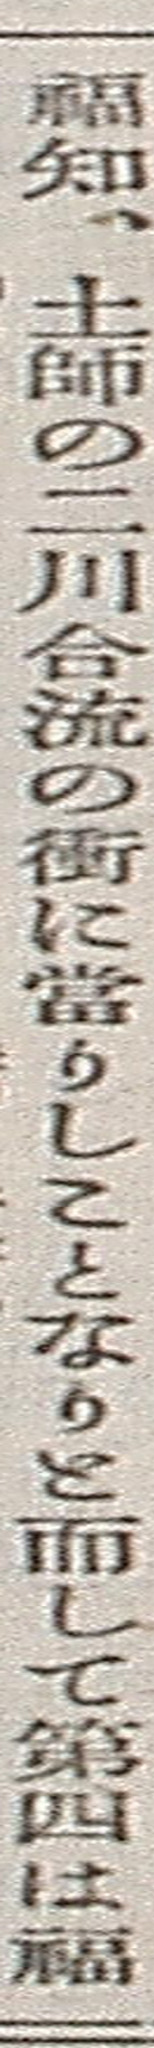福知、土師の二川合流の衛に当りしことなりと而して第四は福
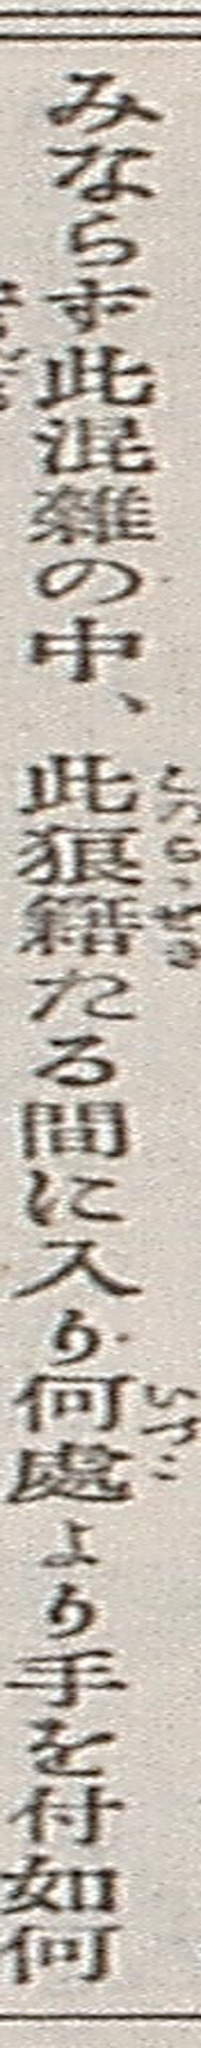みならず此混雑の中、此狼藉たる間に入り何処よりてを付如何
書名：風俗畫報臨時増刊第百二十六號　洪水被害録（中）
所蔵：東京大学地震研究所図書室 Earthquake Research Institute Library, The University of Tokyo, JAPAN
